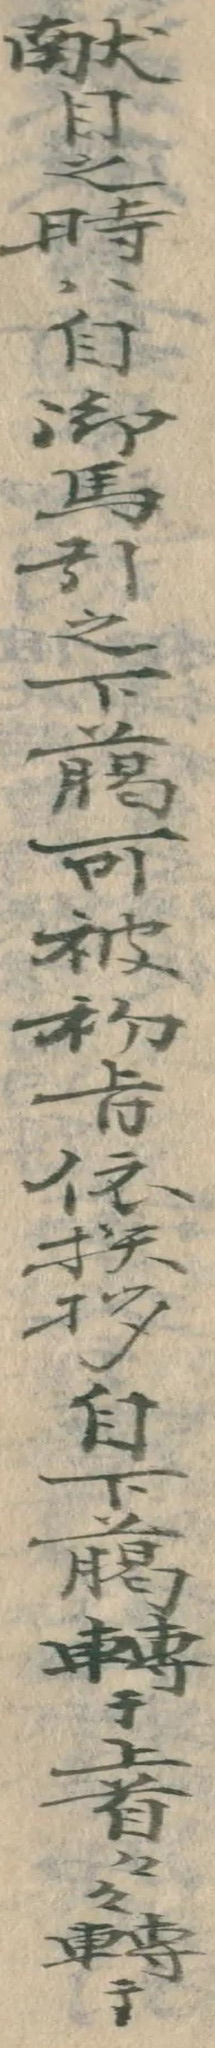献目之時ハ自御馬引之下臈可被初旨依挨拶自下臈転于上首々々転于
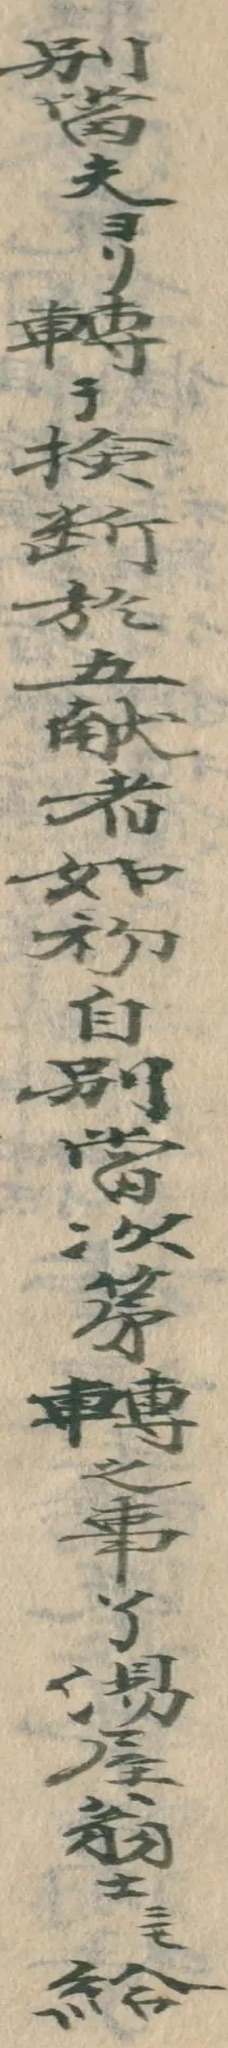別当夫ヨリ転于検断於五献者如初自別当次第転之事了湯屋翁士ニモ給

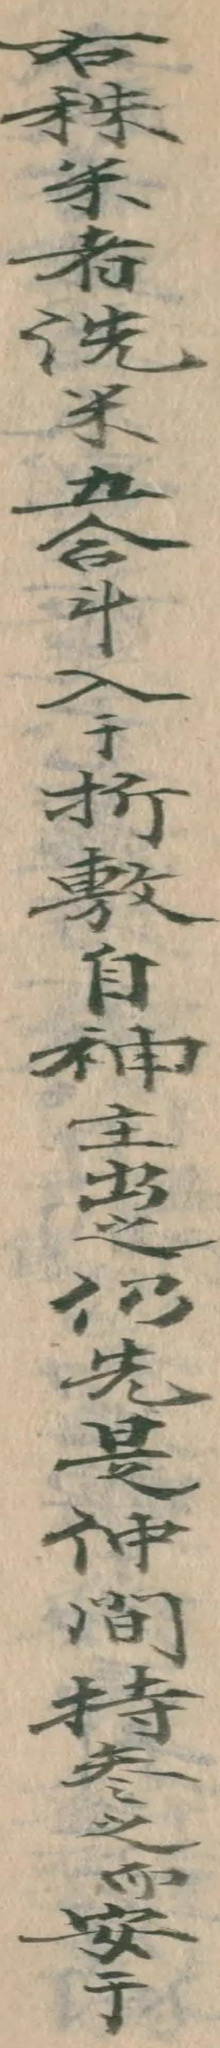右秼米者洗米五合計入于折敷自神主出之仍先是仲間持参之而安于
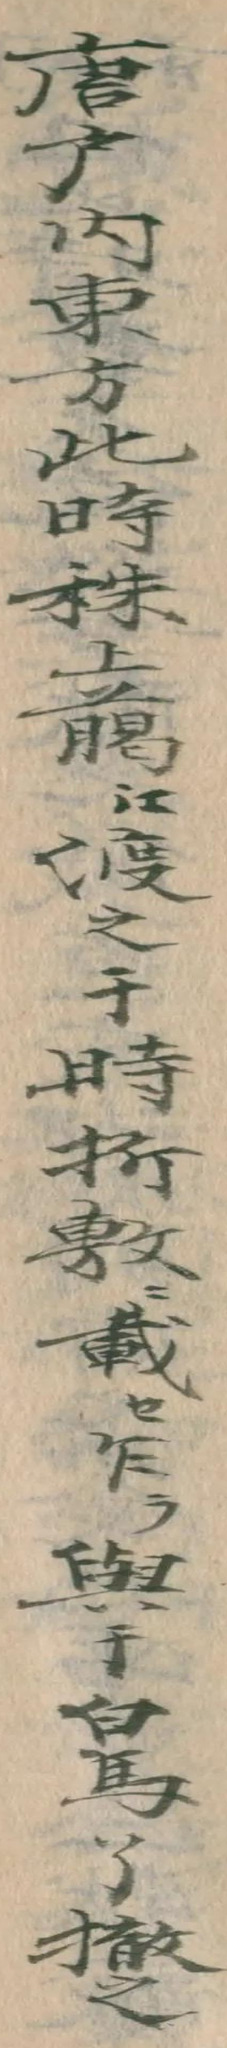唐戸内東方此時秼上臈江渡之于時折敷ニ載セ乍ラ与于白馬了撤之
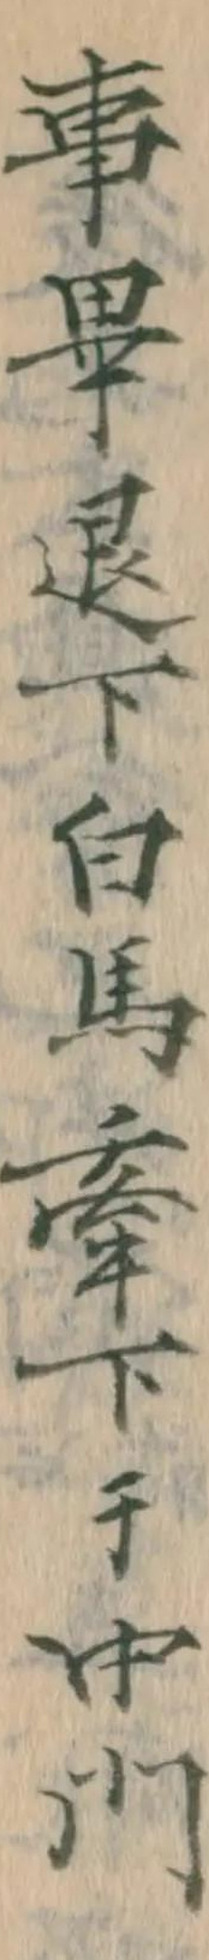事畢退下白馬牽下于中門
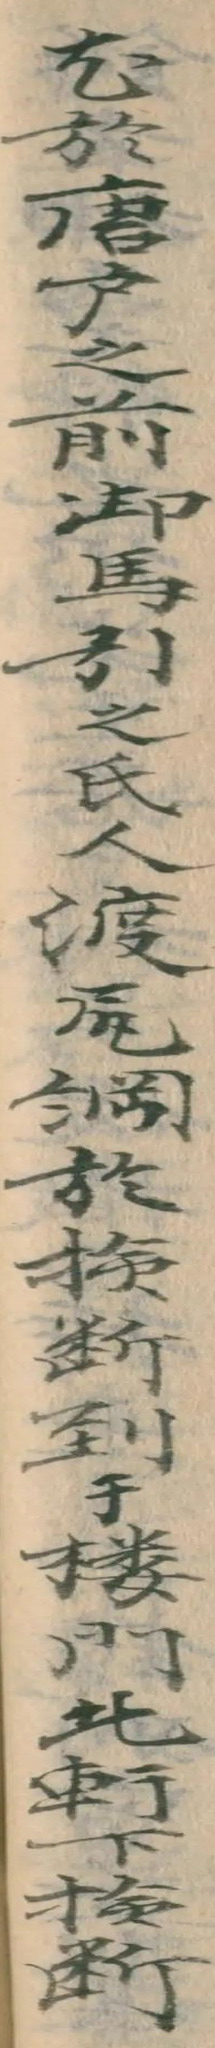尤於唐戸之前御馬引之氏人渡尻綱於検断到于楼門北軒下検断
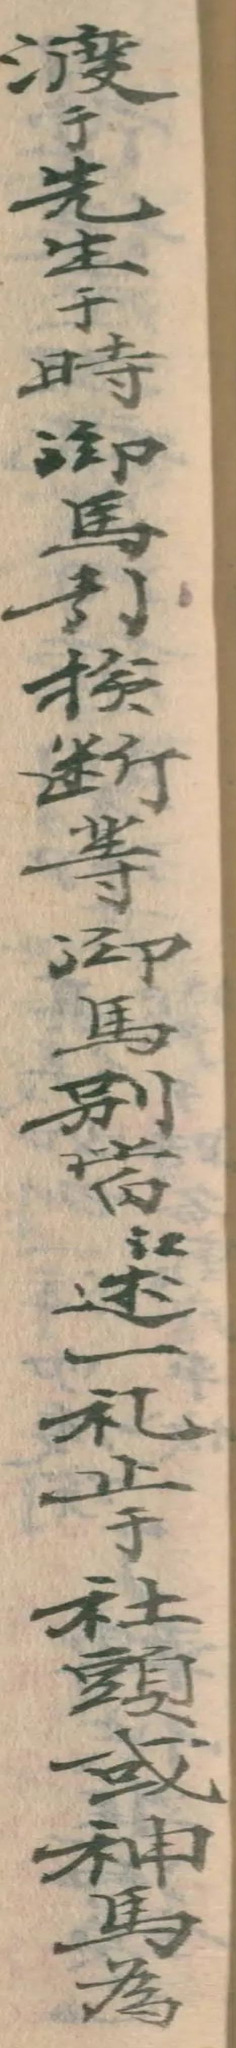渡于先生于時御馬引検断等御馬別当江述一礼止于社頭或神馬為
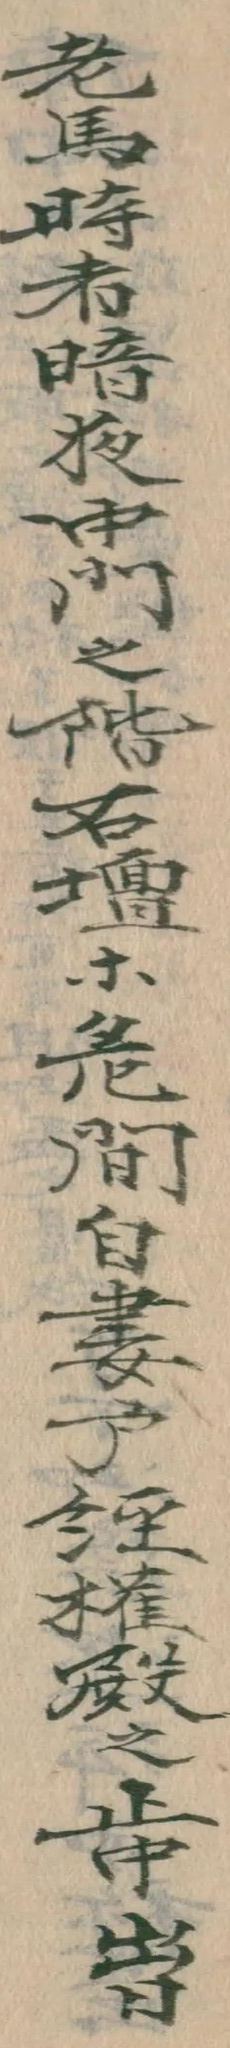老馬時者暗夜中門之階石壇等危間自妻戸経権殿之正中出日
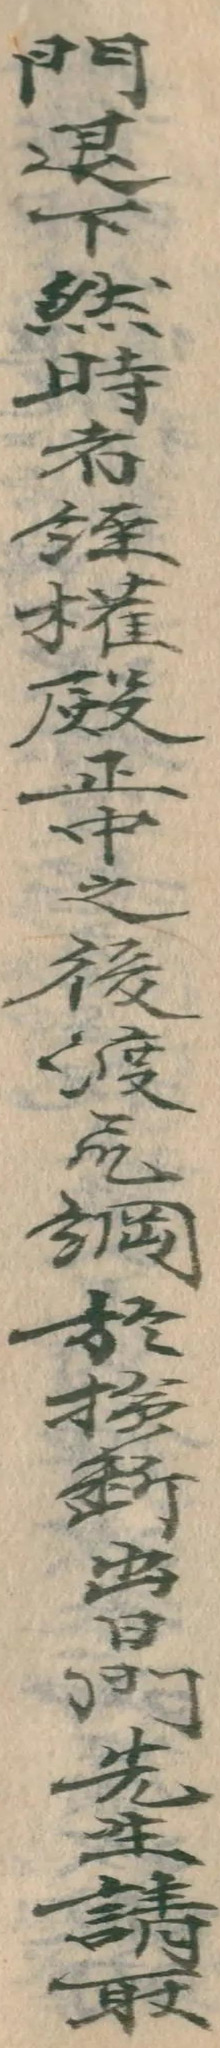門退下然時者経権殿正中之後渡尻綱於検断出日門先生請取
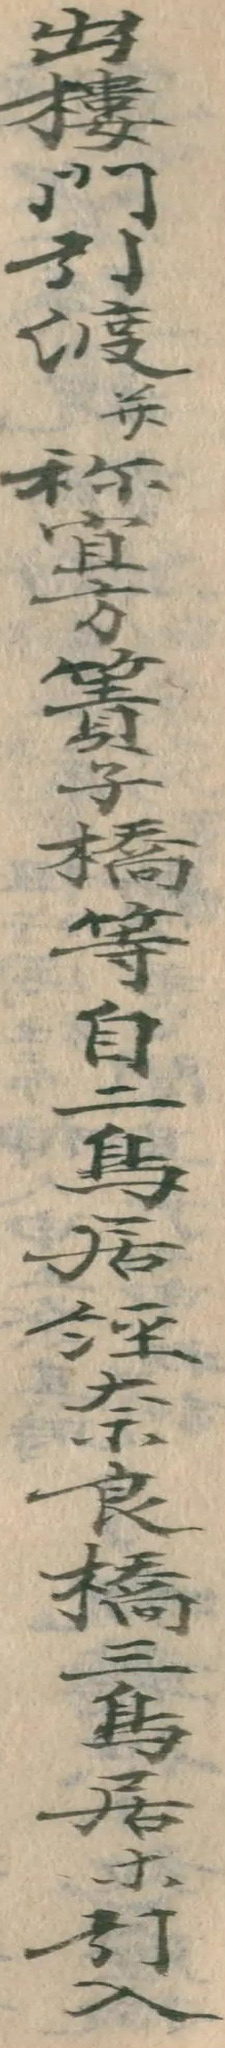出楼門引渡并祢宜方簀子橋等自二鳥居経奈良橋三鳥居等引入
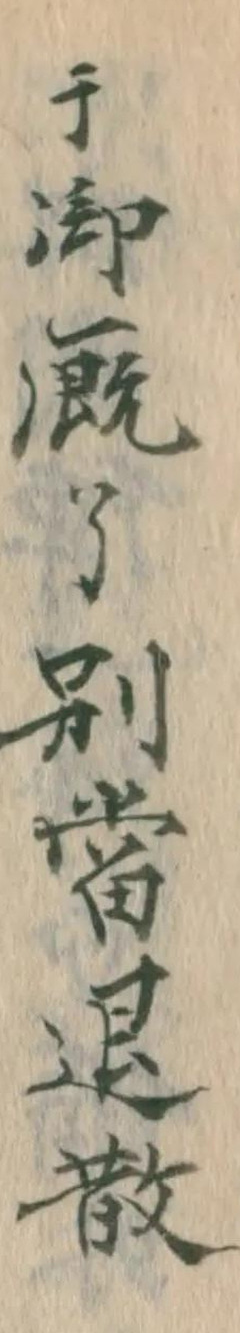于御厩了別当退散
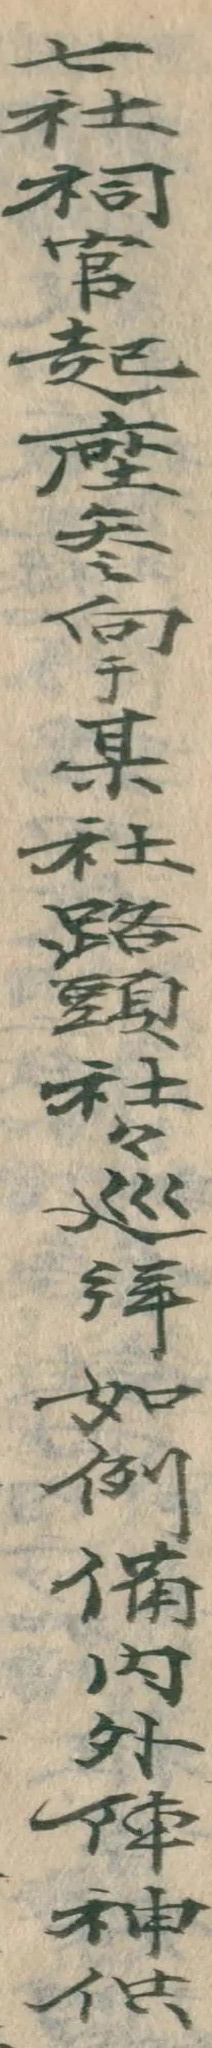七社祠官起座参向于某社路頭社々巡拝如例備内外陣神供

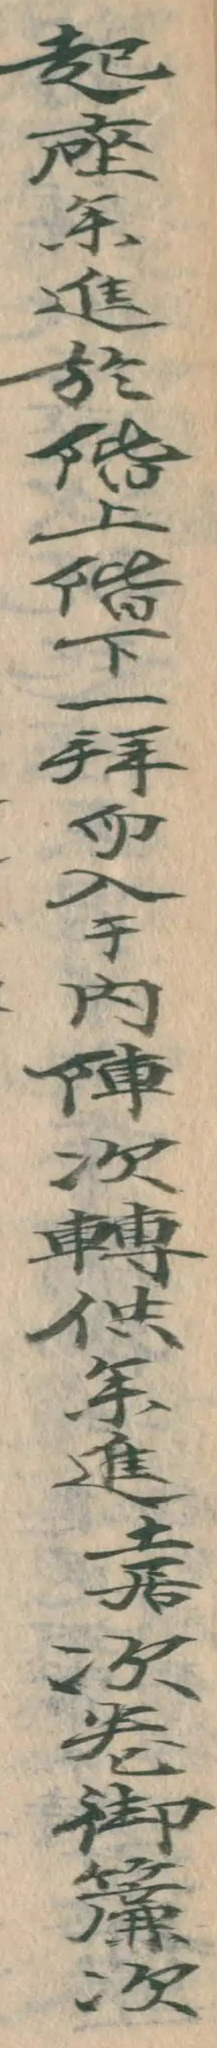起座参進於階上階下一拝而入于内陣次転供参進土居次巻御簾次
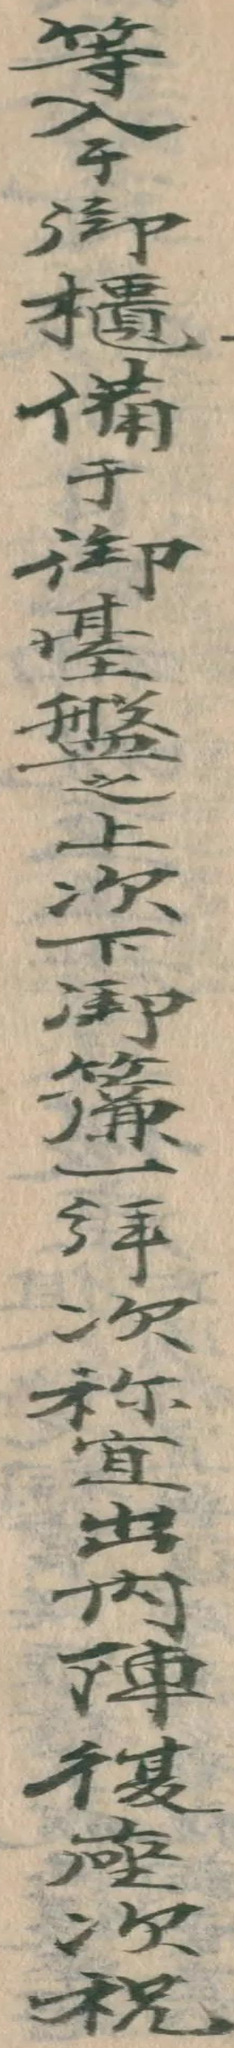等入于御櫃備于御台盤之上次下御簾一拝次祢宜出内陣復座次祝
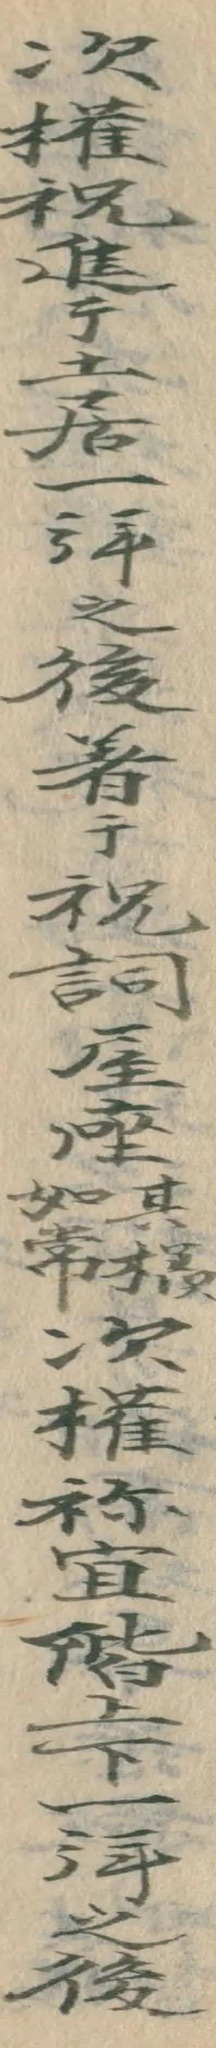次権祝進于土居一拝之後着于祝詞屋座其様如常次権祢宜階上下一拝之後

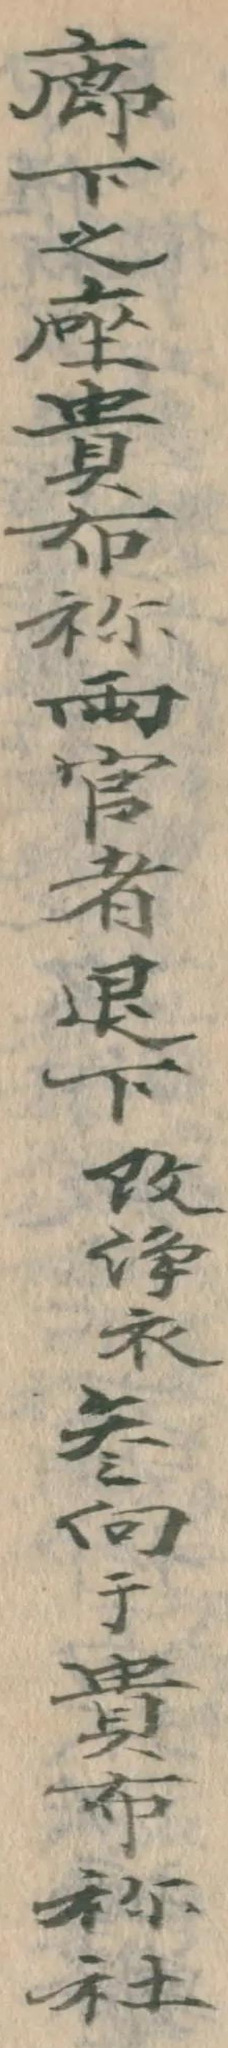廊下之座貴ふね両官者退下改浄衣参向于貴ふね社
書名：賀茂社記録. 第9冊
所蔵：国立国会図書館 National Diet Library, JAPAN
